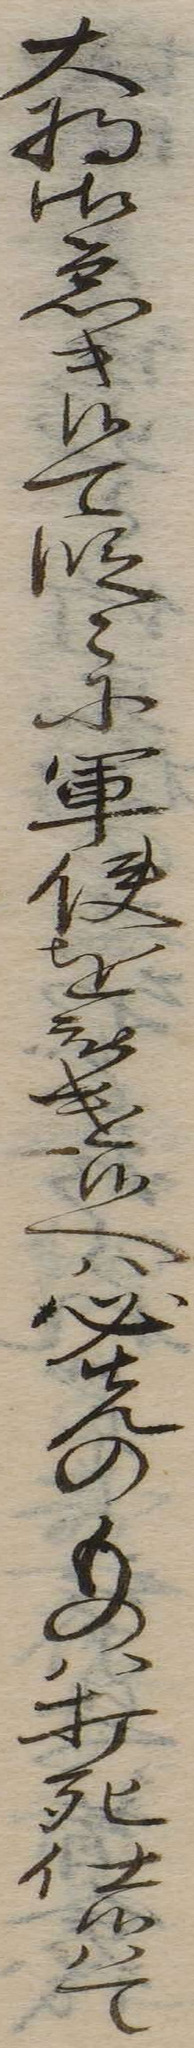大将御急キ候て段々に軍使を被遣候へは必先のものは打死仕候はて
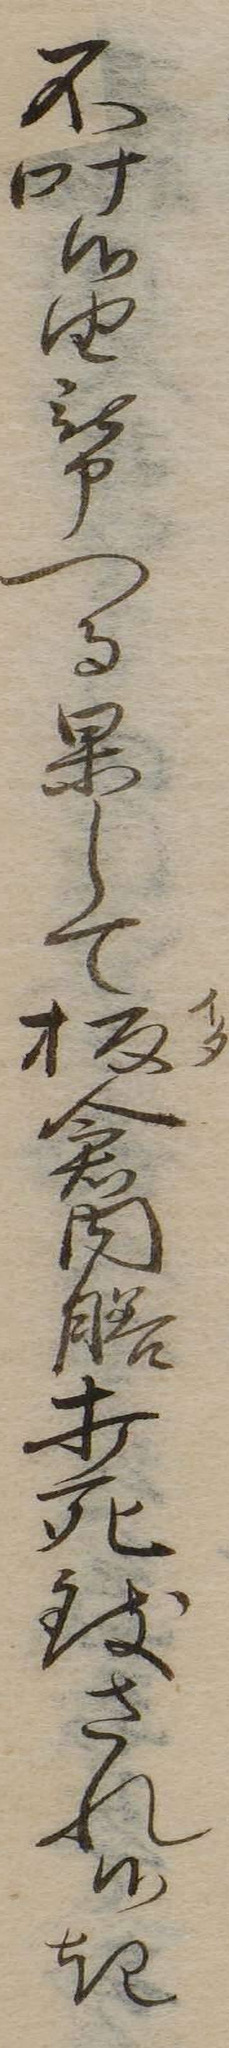不叶候由被申つる果して板倉内膳打死致され候き

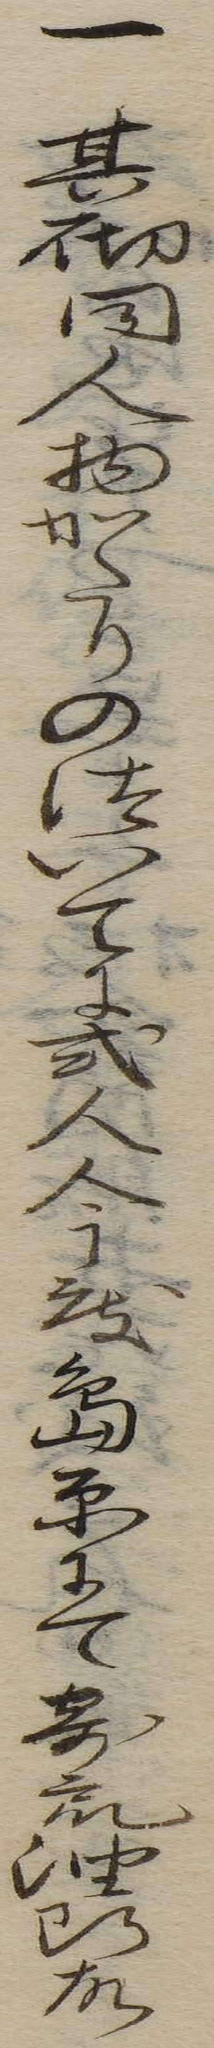一其砌同人物かたりのついてに或人今度島原にて寄衆油断故
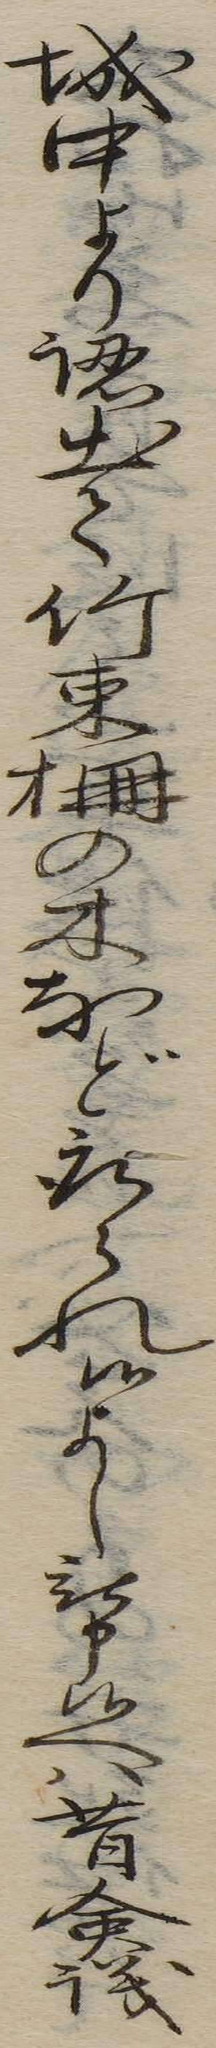城中より認出て竹束柵の木など取られ候よし被申候へは昔僉議
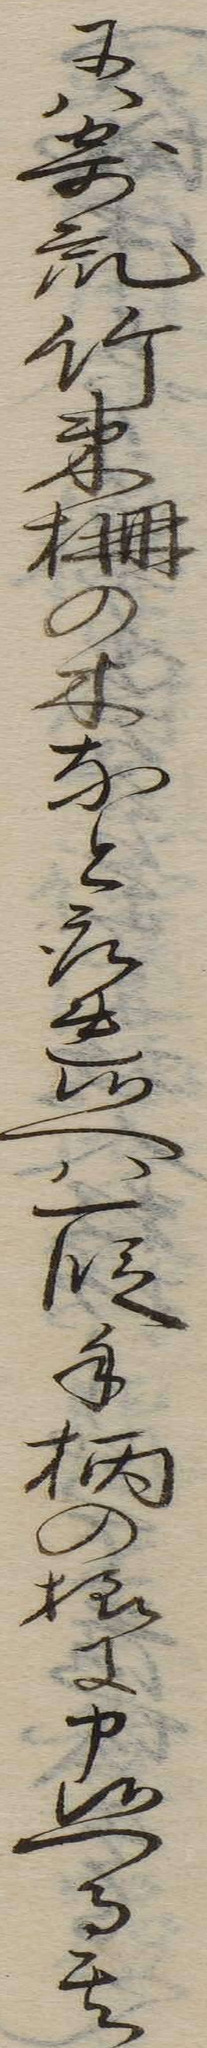には寄衆竹束柵の木なと取れ候へは一段手柄の様に申候つる其
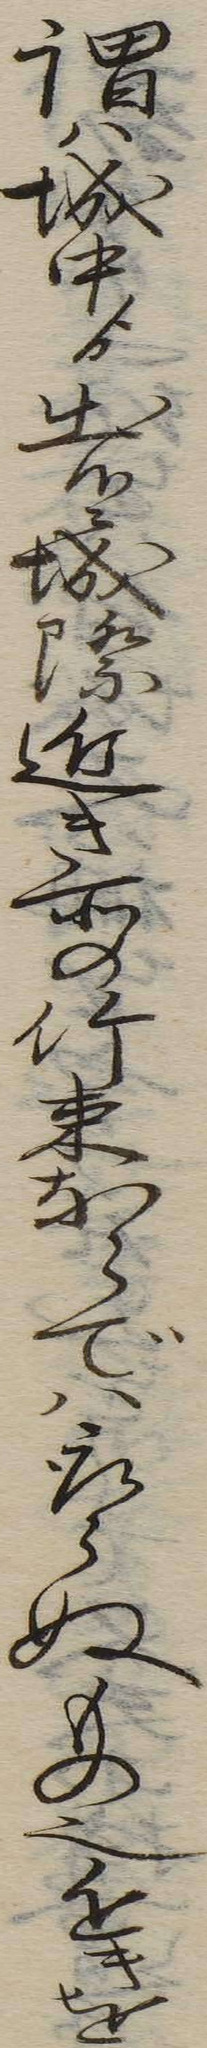謂は城中ゟ出候ニ城際近き所の竹束ならでは取らぬもの也近キを
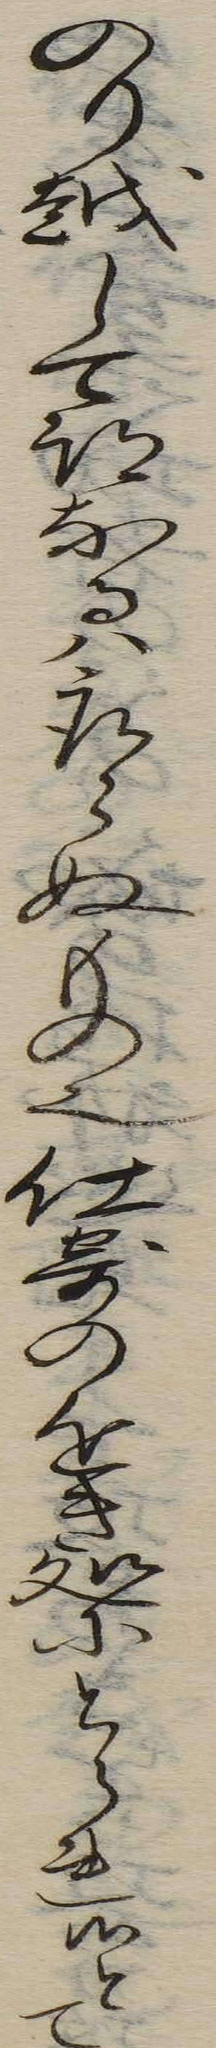のり越して跡なるは取らぬもの也仕寄の近き処にとられ候とて
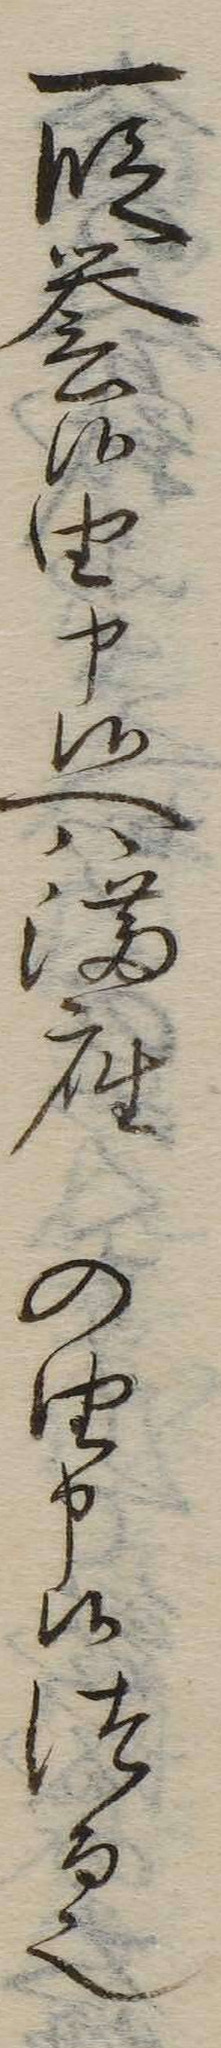一段誉候由申候へは満座の由申候とつる也
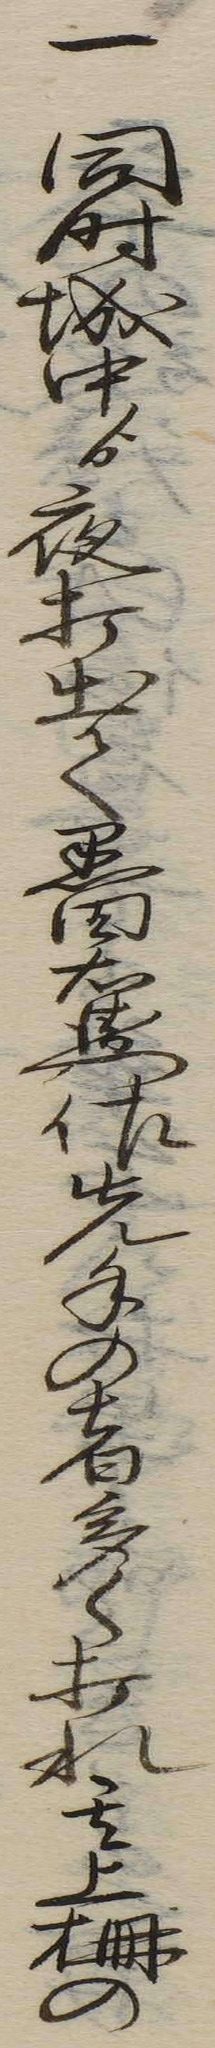一同時城中ゟ夜打出て黒田右衛門佐先手の者多く打れ其上柵の
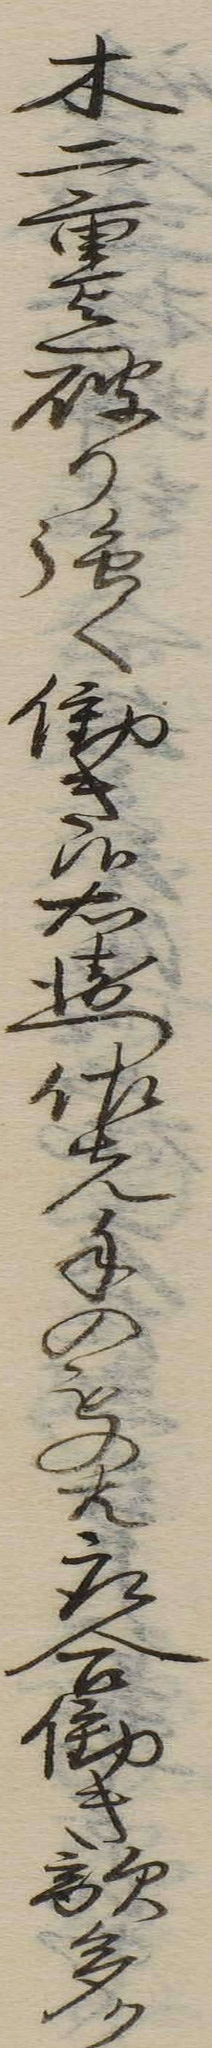木二重迄破り強く働き候右衛門佐先手のもの共取合働き敵多ク
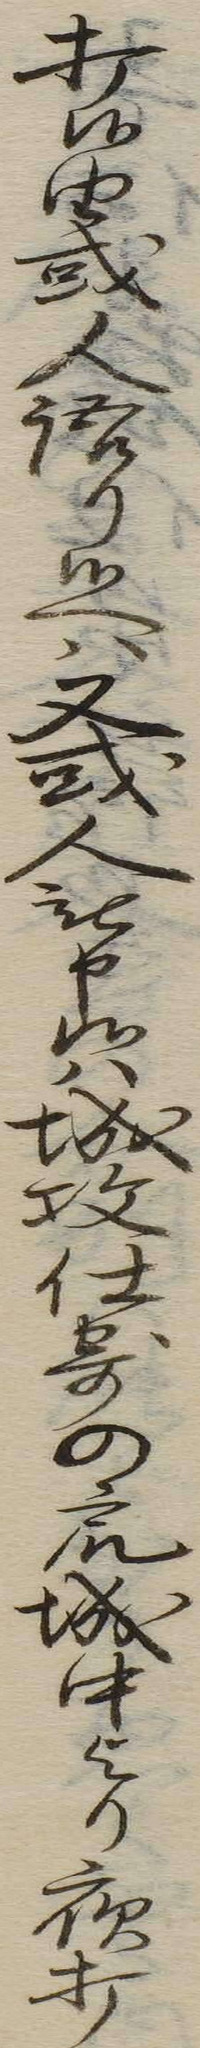打候由或人語り候へは又或人被申候は城攻仕寄の衆城中より夜打
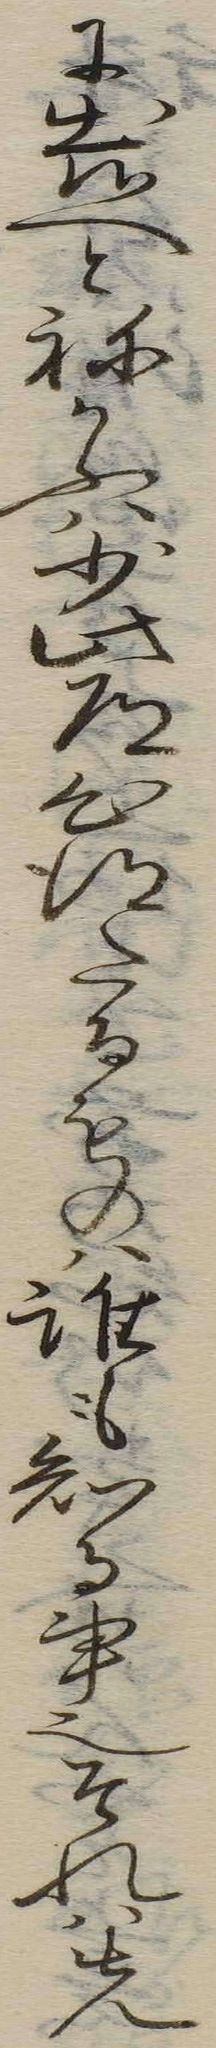に出候へとねかふは少此道心得たるものは誰も知る事也それは先
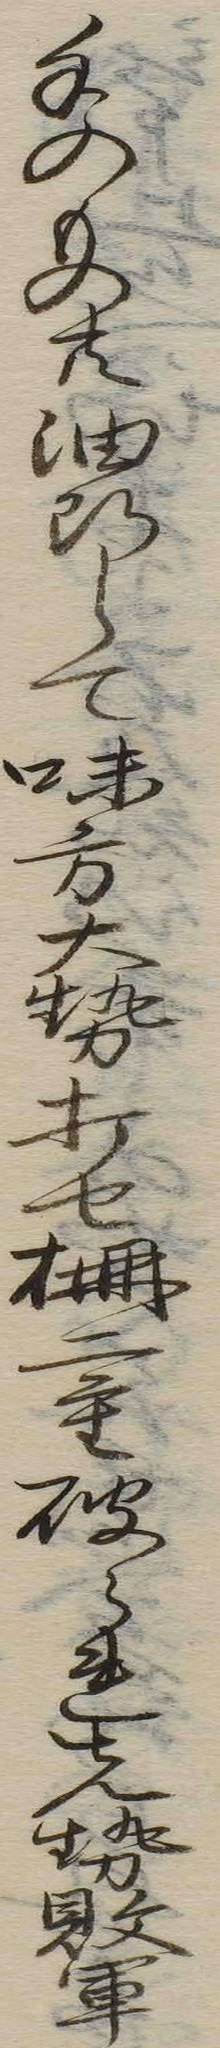手のもの共油断して味方大勢打せ柵二重破られ先勢敗軍
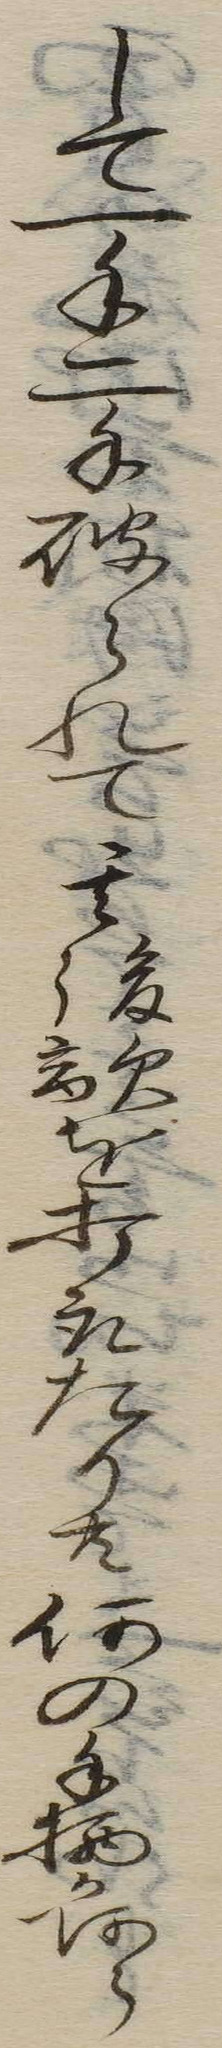して一手二手破られて其後敵を打取たり共何の手柄かあら
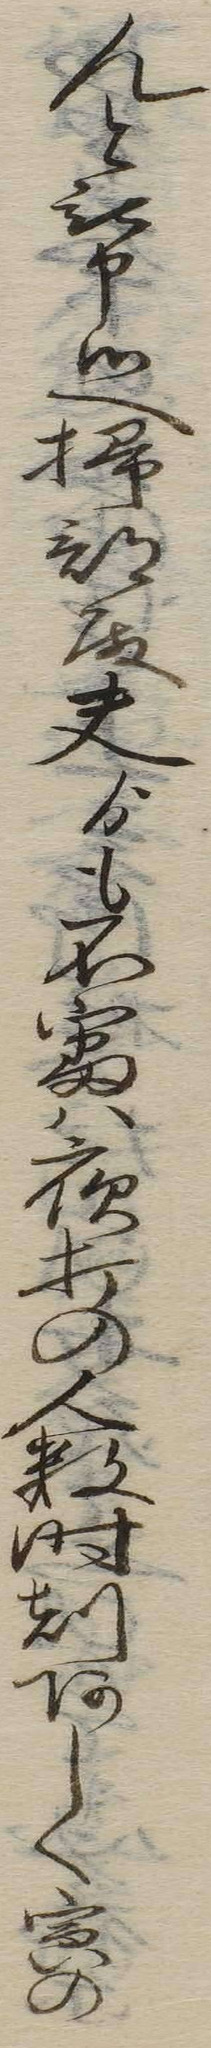んと被申候へ掃部殿夫ゟも不審は夜打の人数時刻あしく寅の
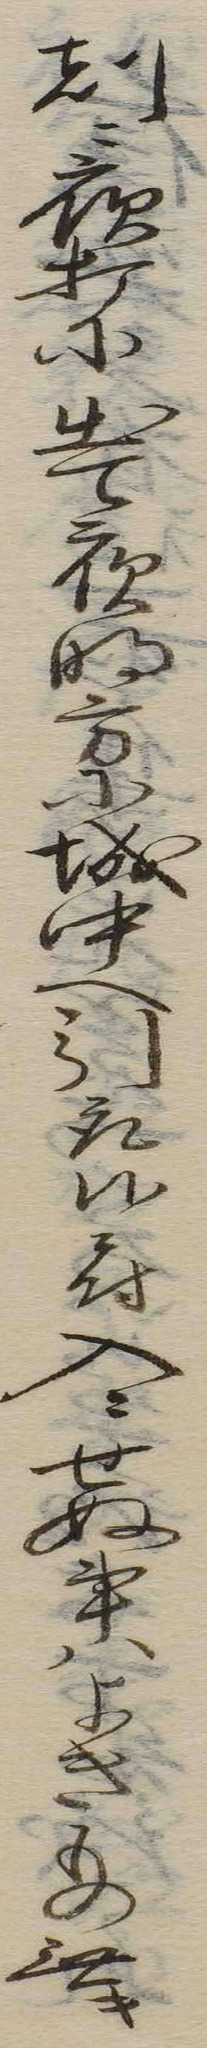刻ニ夜打に出て夜明方に城中へ引取候ニ付入ニせぬ事はよきもの無キ
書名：三河之物語
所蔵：国文学研究資料館
